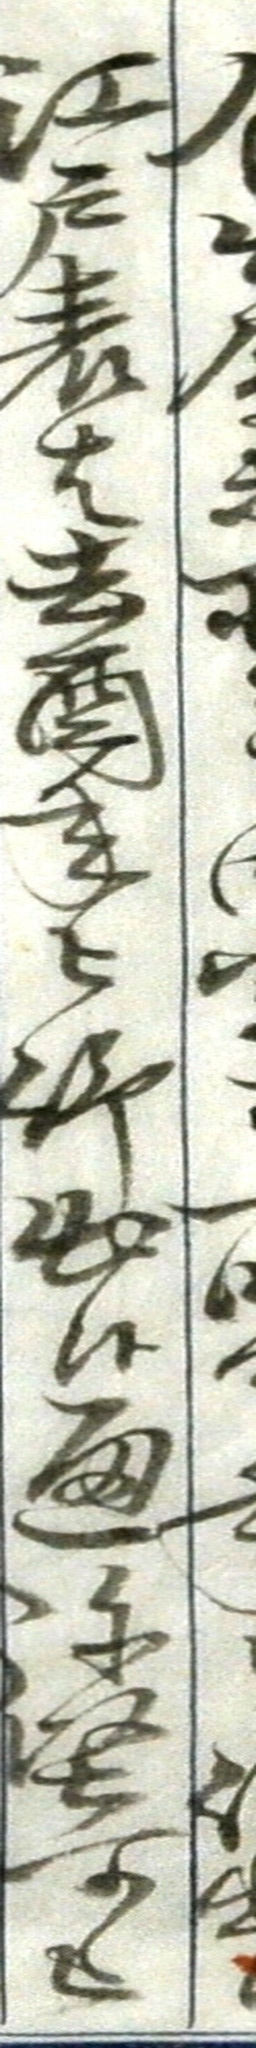江戸表は去酉年被仰出候通弥堅可被
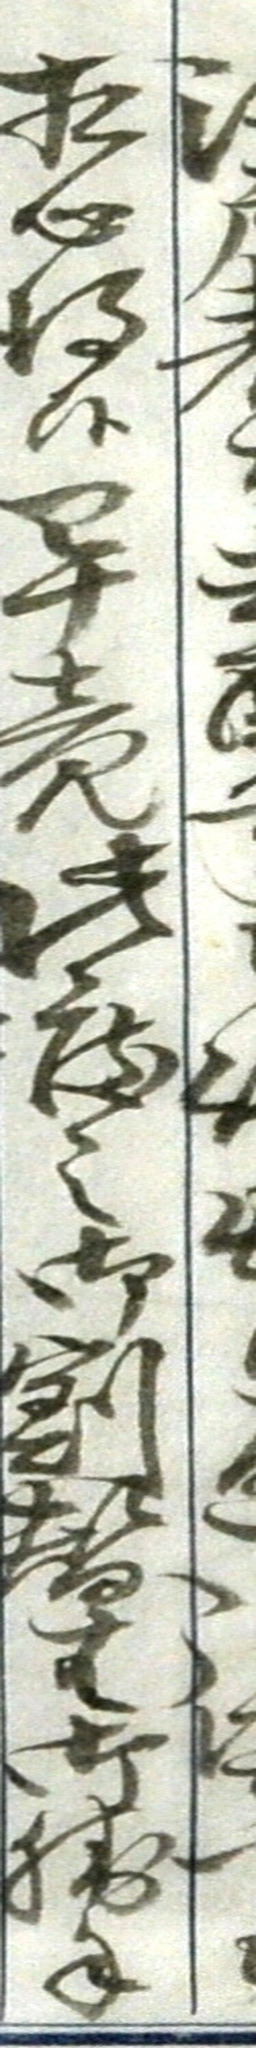相心得候畢竟此度之御割替は御勝手
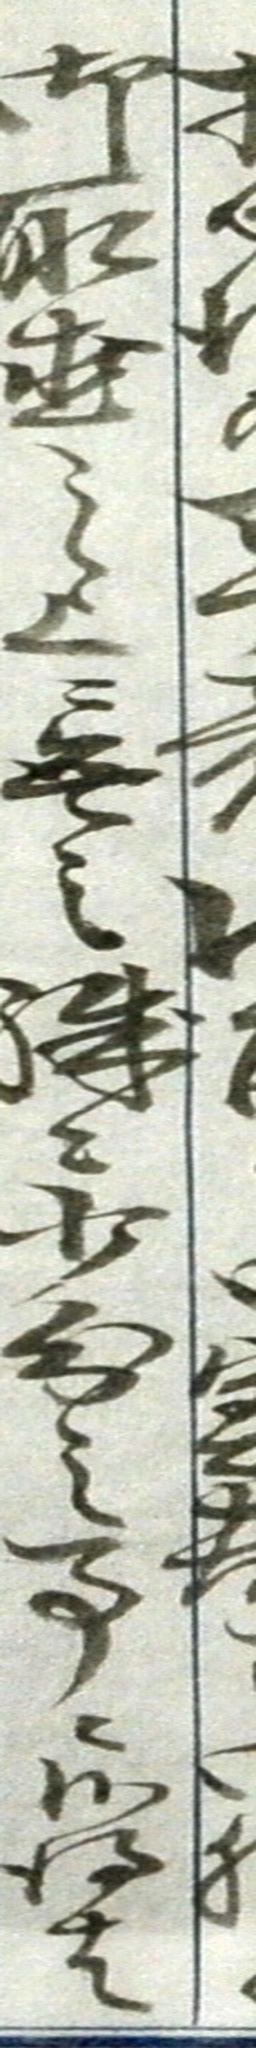御取直之上ニ無之殊ニ少分之事ニ候得は
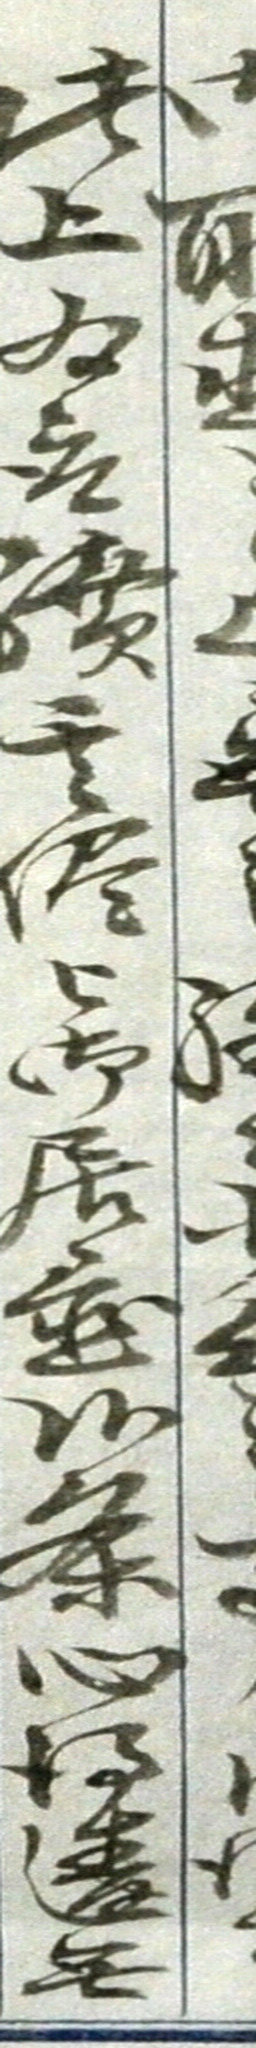此上為取続其侭被御居置候条心得違無
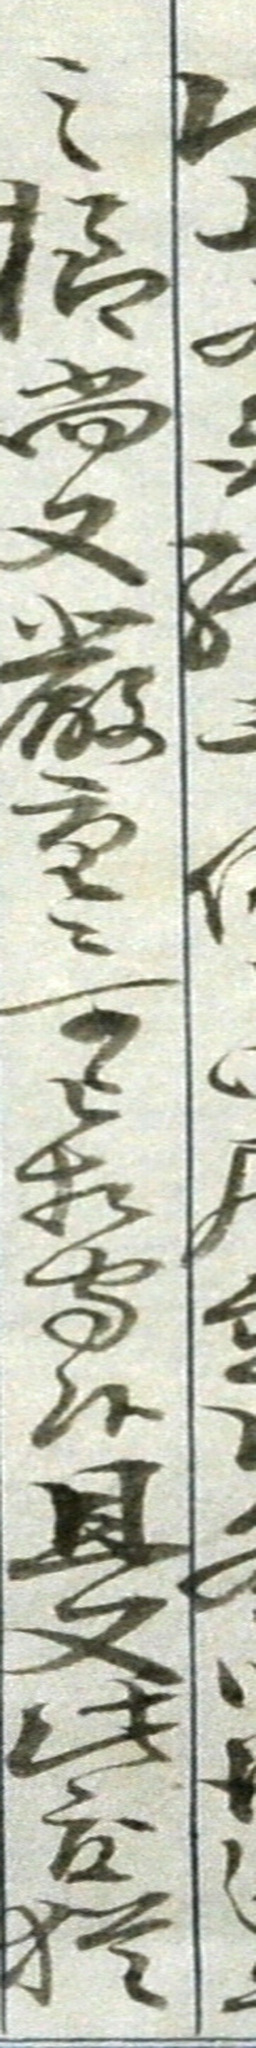之様尚又厳重ニ可被相守候且又此度猶
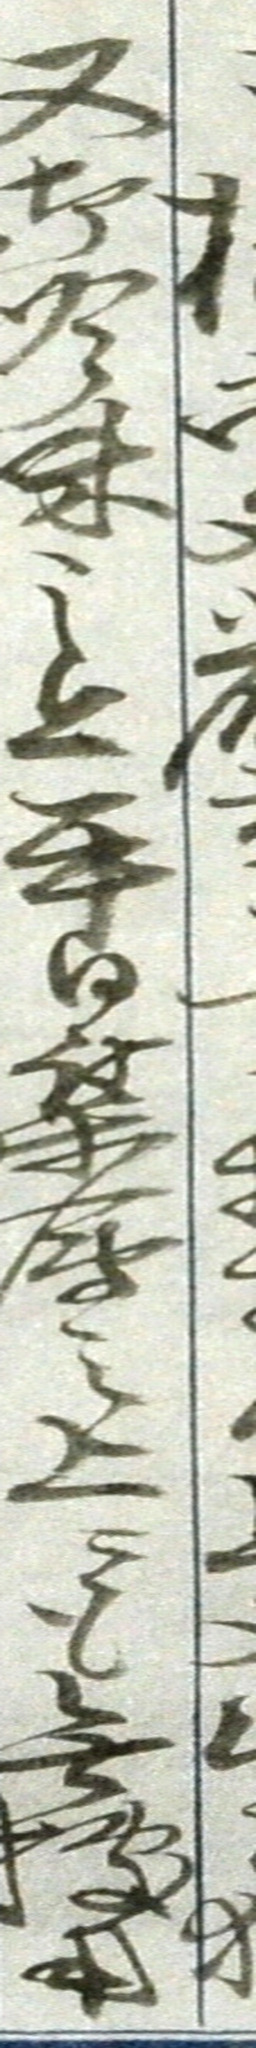又御吟味之上平日集会之上ニも無拠用
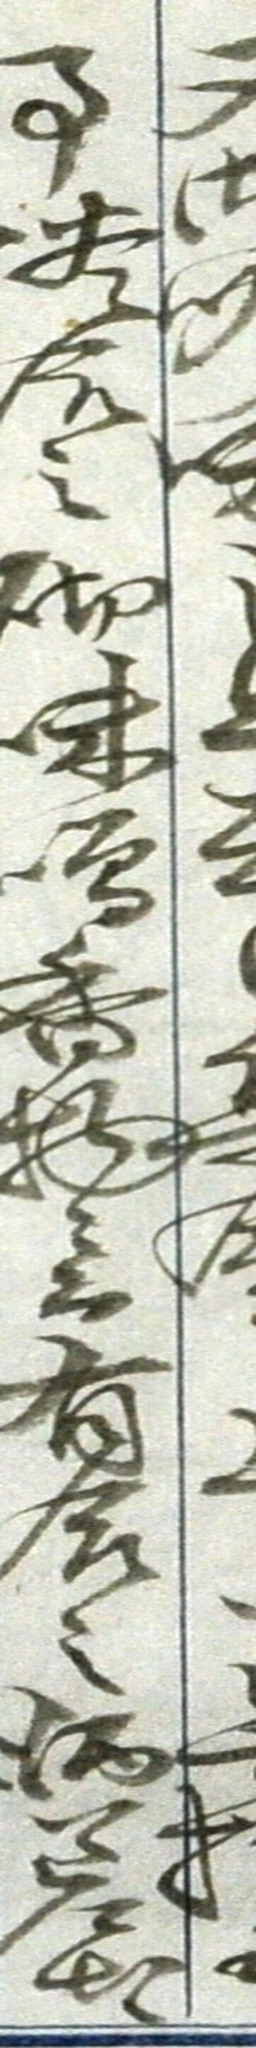事談合之砌味噌香物ニ而有合之酒差出
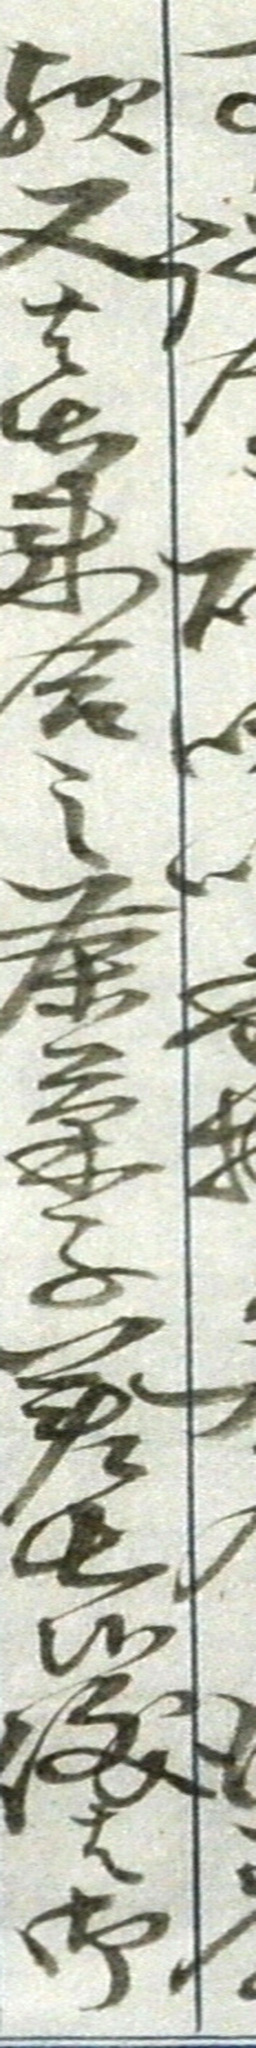欤又は出来合之茶菓子差出候儀は御
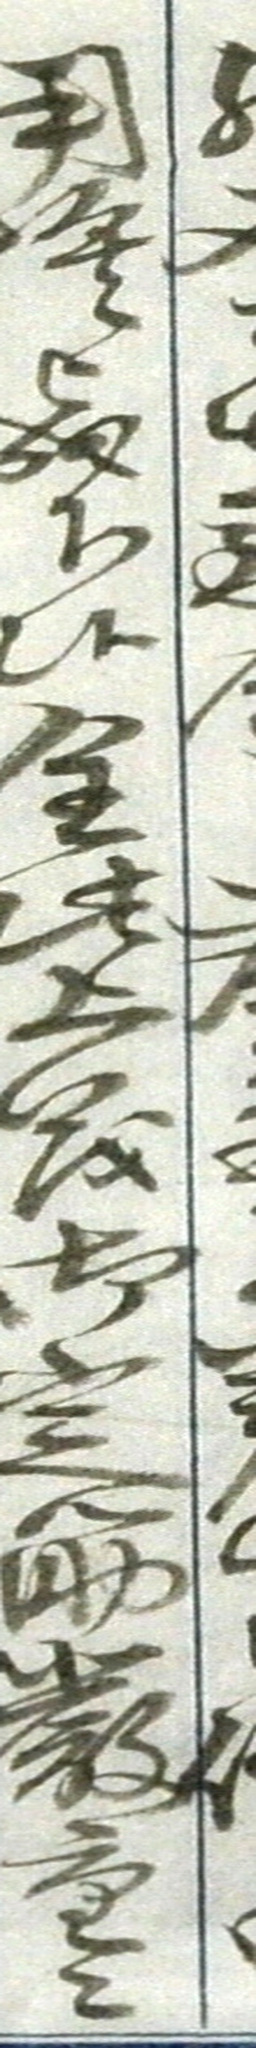用捨被成下候全此上茂御定筋厳重ニ
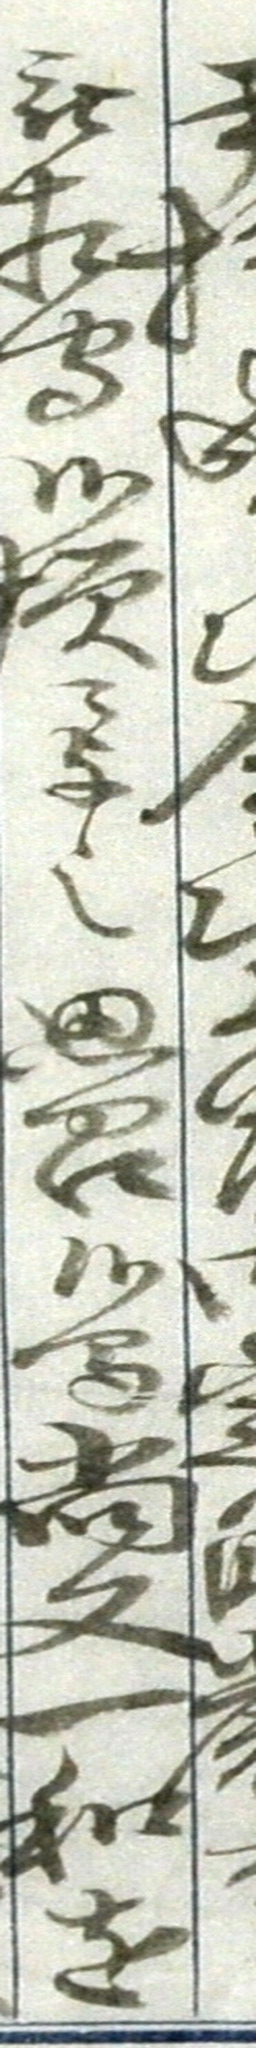被相守候様ニ与也思召候間尚又一和を
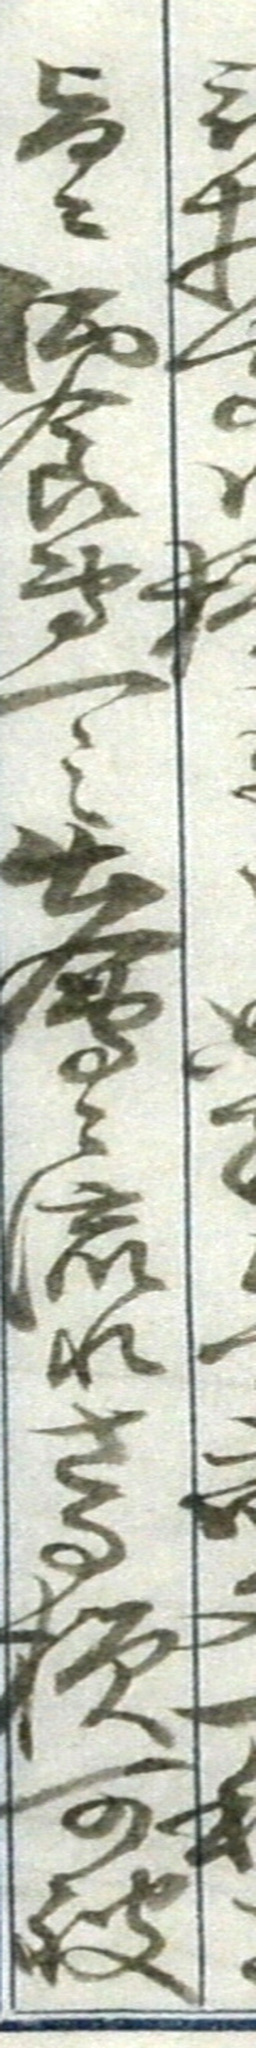旨ニ酒食専一之出会ニ流れさる様可致
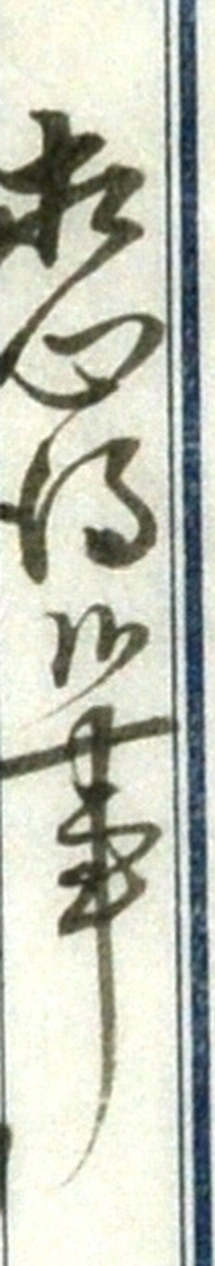相心得候事
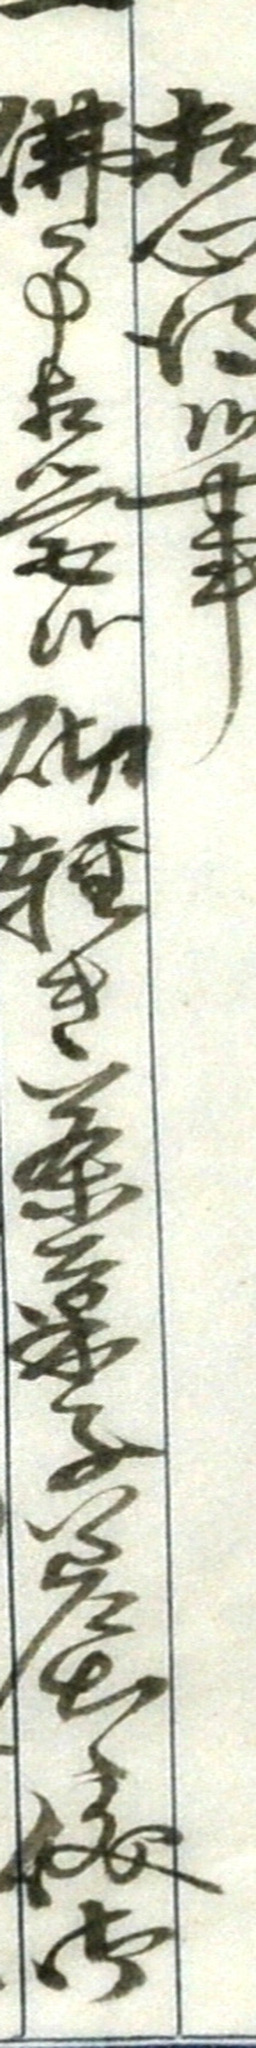一仏事相候砌軽き茶菓子差出儀御
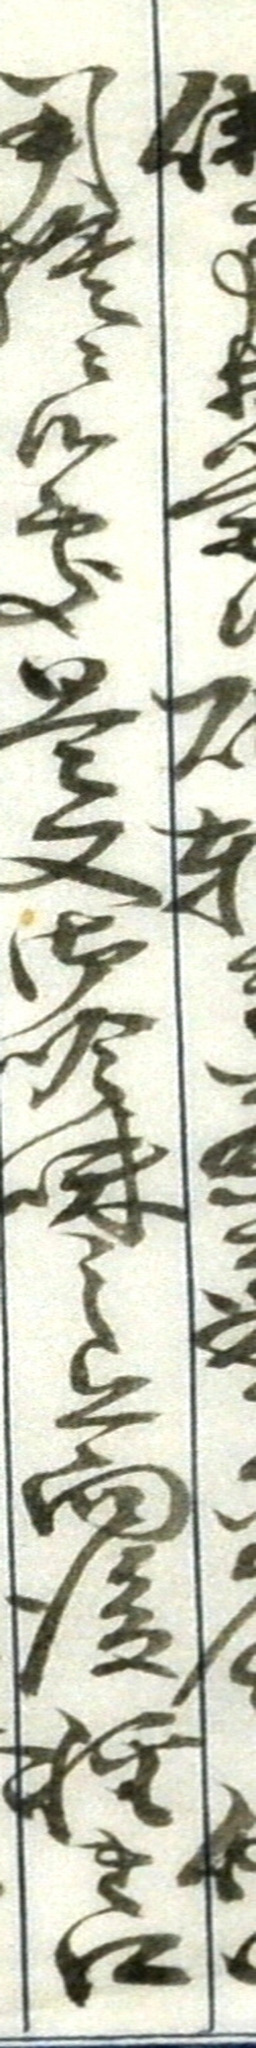用捨ニ候処是又御吟味之上向後軽き口
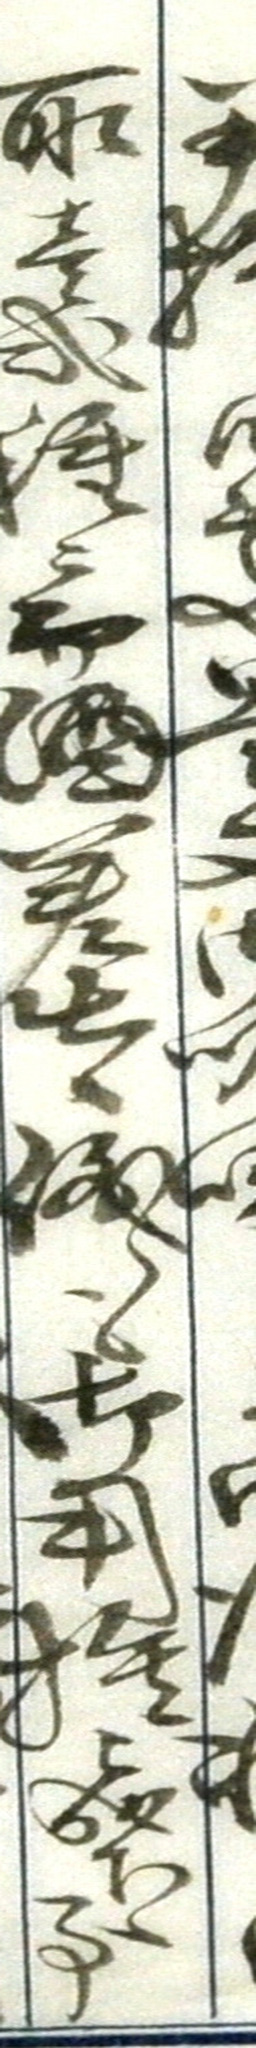取壱弐種ニ而酒差出候儀も御用捨被成下候事
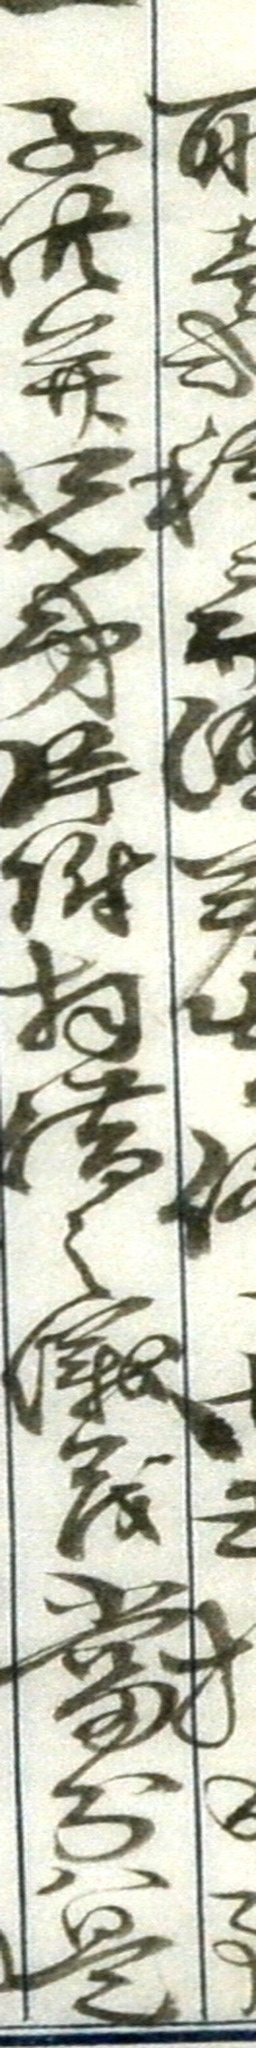一子供并兄弟片附拝借之儀茂当分ハ是
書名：御倹約御直書并仰書
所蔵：伊那市立高遠町図書館・合同会社AMANE
